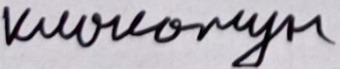клокотун
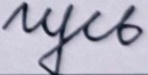гусь
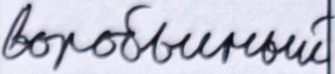воробьиный
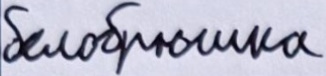белобрюшка
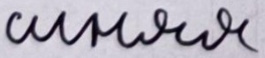синяя
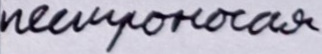пестроносая
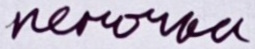пеночка
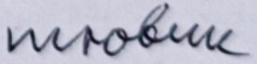тювик
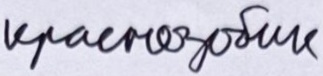краснозобик
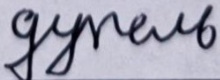дупель
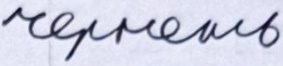чернеть
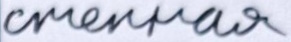степная
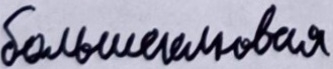большеклювая
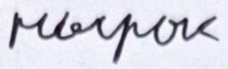нырок
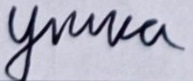утка
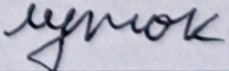луток
